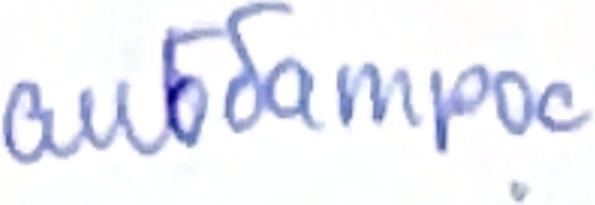алббатрос
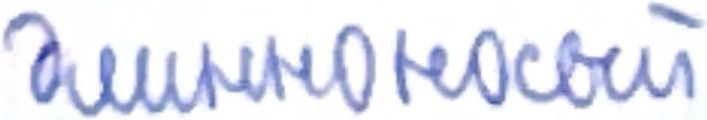длинноносый
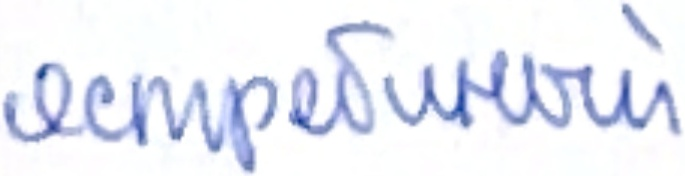ястребиный
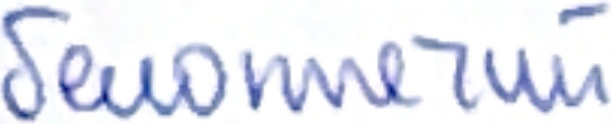белоплечий
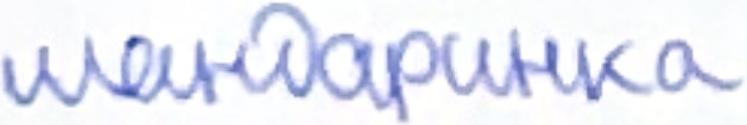мандаринка
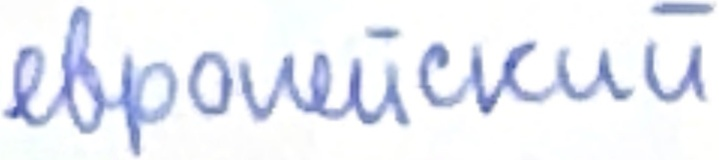европейский
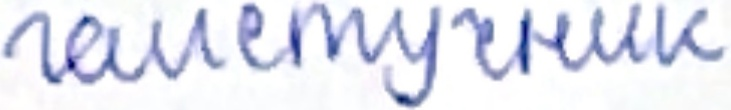галстучник
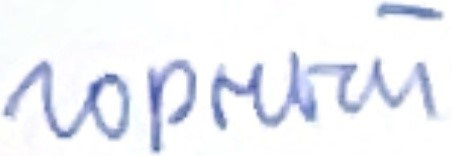горный
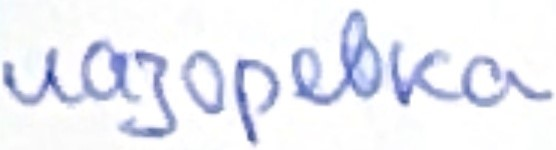лазоревка
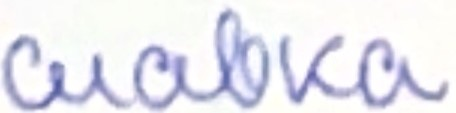славка
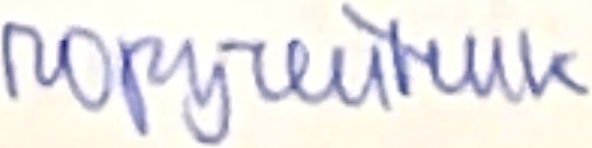поручейник
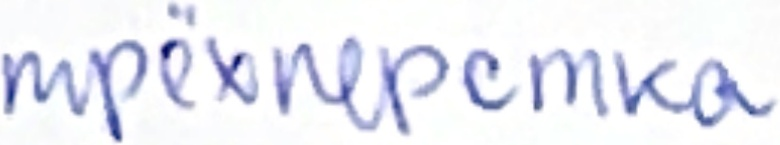трёхперстка
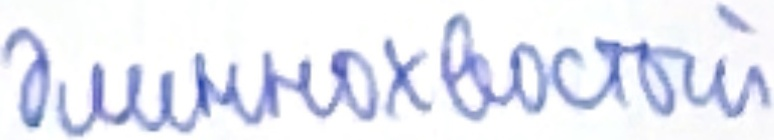длиннохвостый
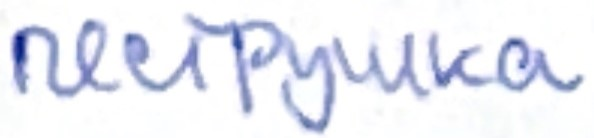пеструшка
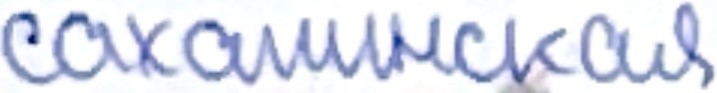сахалинская
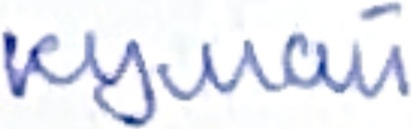кумай
